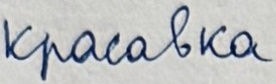красавка
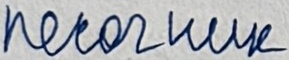песочник
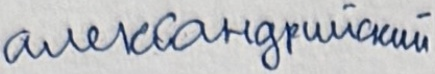александрийский
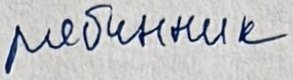рябинник
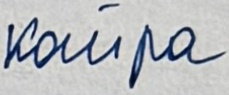кайра
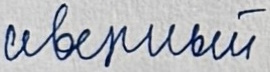северный
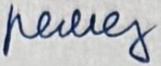ремез
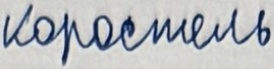коростель
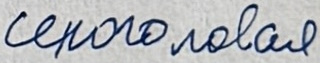сероголовая
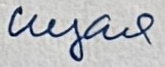сизая
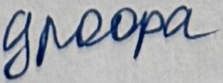дрофа
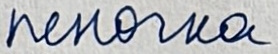пеночка
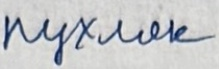пухляк
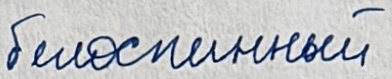белоспинный
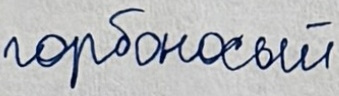горбоносый
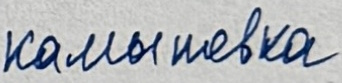камышевка
